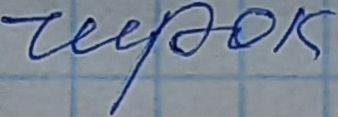чирок
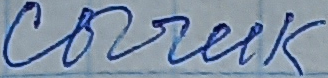сычик
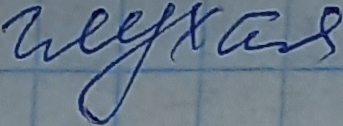глухая
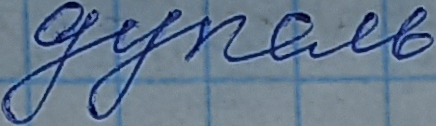дупель
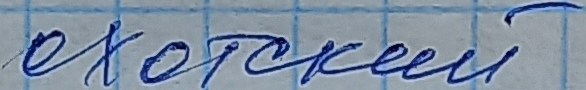охотский
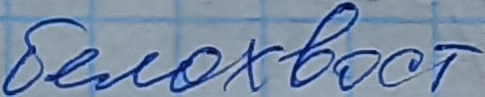белохвост
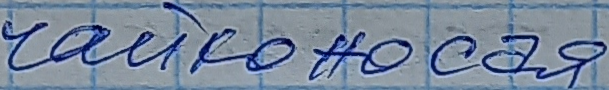чайконосая
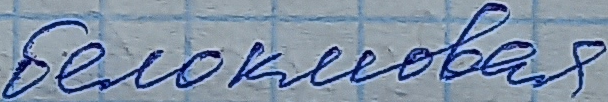белоклювая
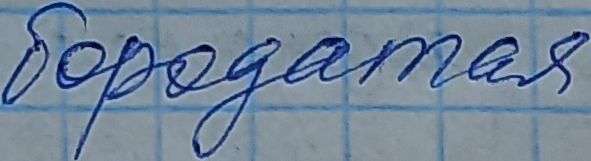бородатая
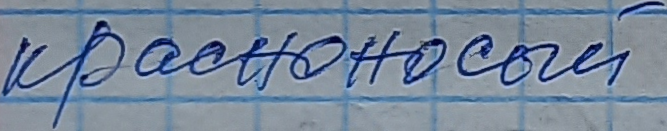красноносый
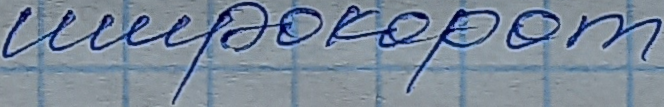широкорот
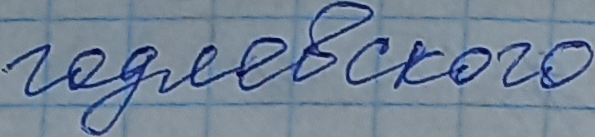годлевского
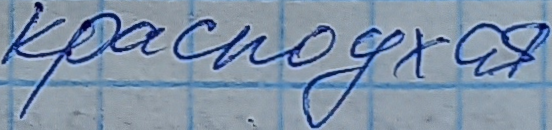красноухая
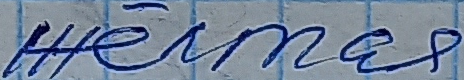жёлтая
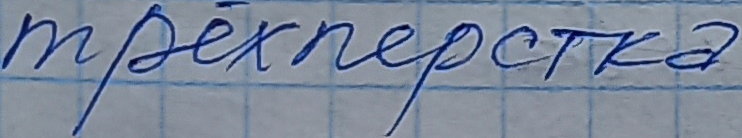трехперстка
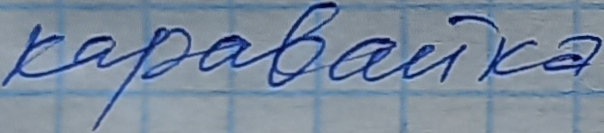каравайка
